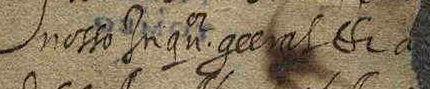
nosso Inqu.or geeral &c a
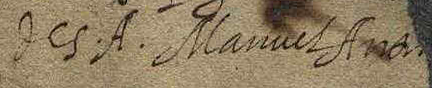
de s. A. Manuel Antu
